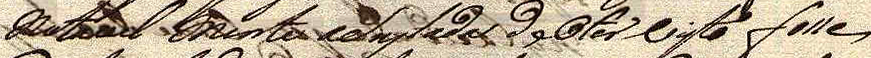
naturalmente asustada de o ter visto fosse
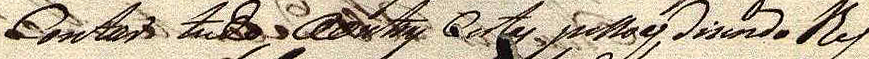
Contar tudo a outras certas pessoas, disendo lhes
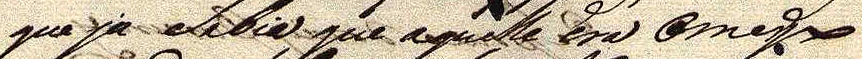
que ja sabia que aquelle era o meyo
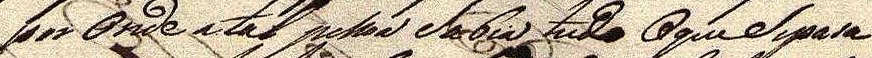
por onde a tal pessoa sabia tudo O que se pasa
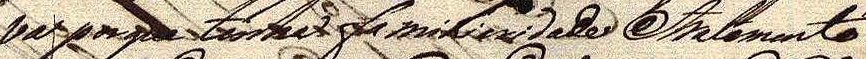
va porque tinha familiaridade e tratamento
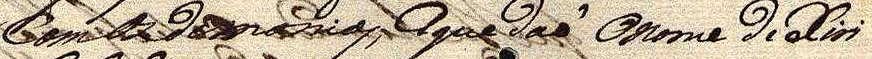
com os demonios, a que daõ o nome de Xiri
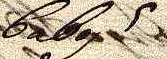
babos?
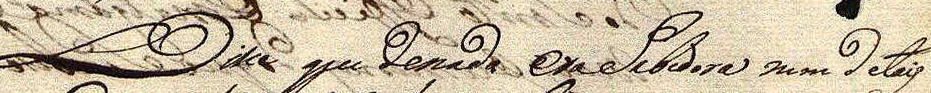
Disse que de nada era sabedora nem de tais
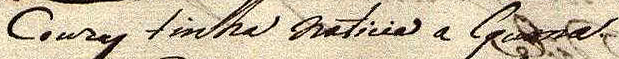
Couzas tinha noticia alguma.
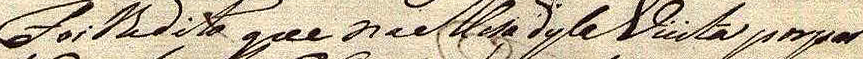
Foilhe dito que na Mesa desta Visita por par
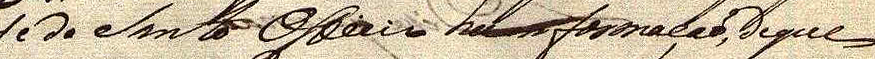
te do santo Officio h_ _nformaçaõ, de que
